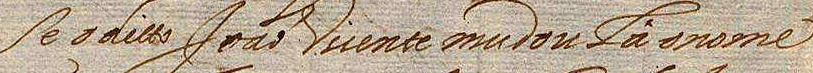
se o ditto Joaõ Vicente mudou Lâ o nome
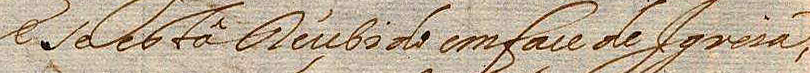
E se estâ Reçebido em façe de Jgreia,
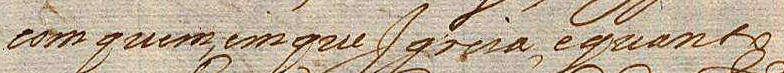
com quem, em que Jgreia, e quanto
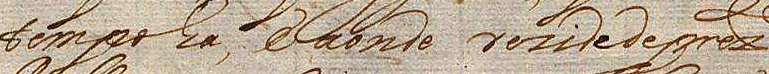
tempo ha, E aonde rezide de prez.te
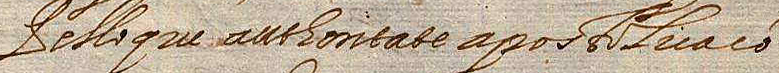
Pello que authoritate apostoLica cō
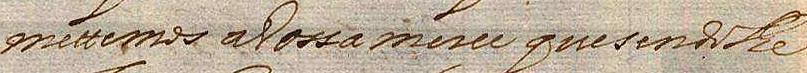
mettemos a Vossa merçe que sendolhe
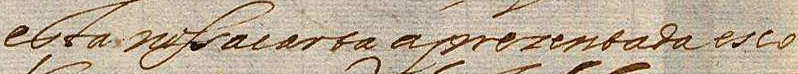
esta nossa carta aprezentada esco
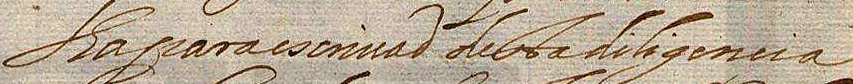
lha para escriuão desta diligencia
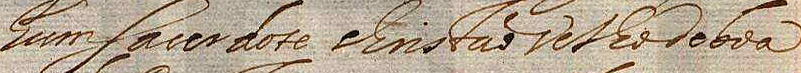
hum Sacerdote christaõ velho de boa
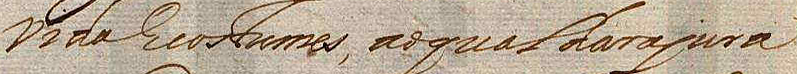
vida E costumes, ao quaL dara jura
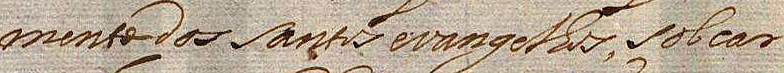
mento dos santos evangelhos, sob car
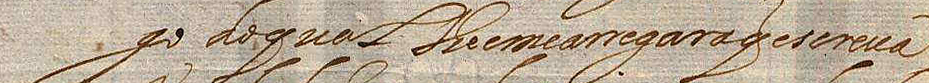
go do quaL lhe emcarregara q̄ escreua
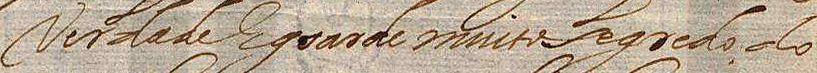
Verdade E goarde muito segredo do
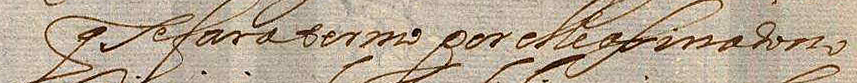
q̄ se fara termo por elle assinado no
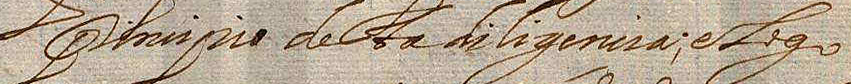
principio desta diligençia; e Logo
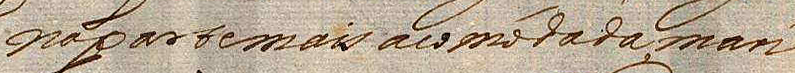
na parte mais acomodada man
